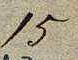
15
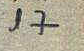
17
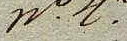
n.o 4.o
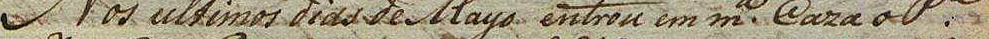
Nos ultimos dias de Mayo entrou em ma. Caza o P.e
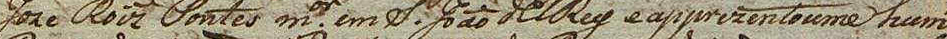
Joze Roiz̄ Pontes m.or em S. Joâo dEl Rey e apprezentoume hum
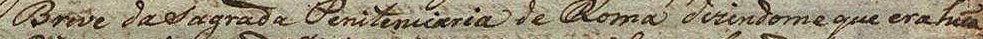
Breve da Sagrada Penitenciaria de Roma dizendome que era hūa
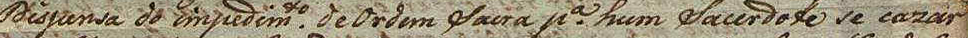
Dispensa do impedimto. de Ordem Sacra pa. hum Sacerdote se cazar
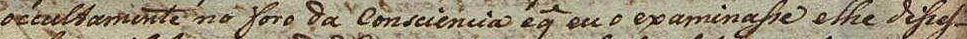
occultamente no foro da conscienia e q̄ eu o examinasse e lhe disses
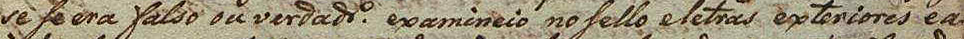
se se era falso ou verdadr.o examineio no sello e letras exteriores e a
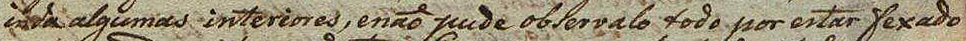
inda algumas interiores, e não pude observalo todo por estar fexado
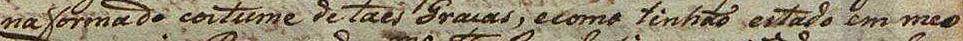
na forma do costume de taes Graças, e como tinhão estado em meo
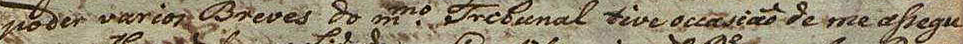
poder varios Breves do mmo. Tribunal tive occasiaô de me assegu
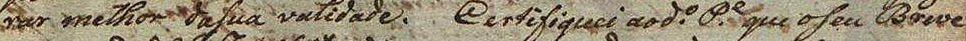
rar melhor da sua validade. Certifiquei ao d.o P.e que o seu Breve
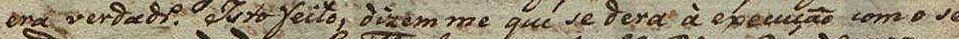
era verdadr.o Isto feito, dizemme que se dera à execução com o se
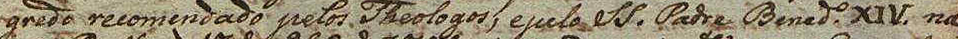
gredo recomendado pelos Theologos, e pelo SS. Padre Bened.o XIV. na
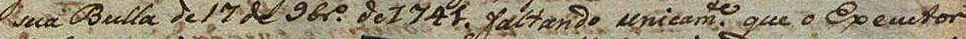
sua Bulla de 17 de 9br.o de 1741. faltando unicamte. que o Executor
